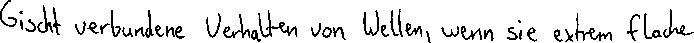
Gischt verbundene Verhalten von Wellen, wenn sie extrem flache
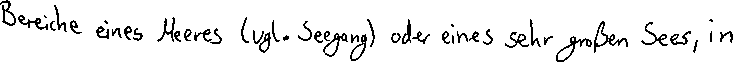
Bereiche eines Meeres (vgl. Seegang) oder eines sehr großen Sees, in
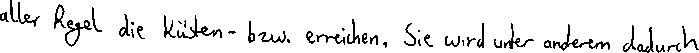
aller Regel die Küsten- bzw. erreichen. Sie wird unter anderem dadurch
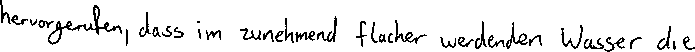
hervorgerufen, dass im zunehmend flacher werdenden Wasser die
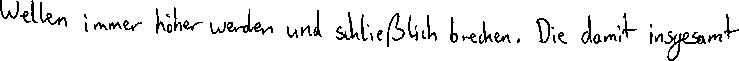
Wellen immer höher werden und schließlich brechen. Die damit insgesamt
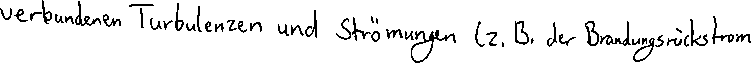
verbundenen Turbulenzen und Strömungen (z. B. der Brandungsrückstrom
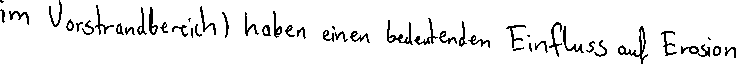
im Vorstrandbereich) haben einen bedeutenden Einfluss auf Erosion
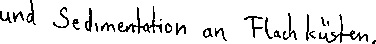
und Sedimentation an Flachküsten.
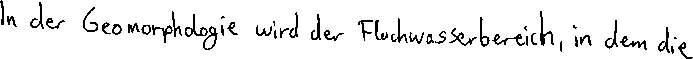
In der Geomorphologie wird der Flachwasserbereich, in dem die
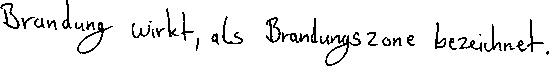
Brandung wirkt, als Brandungszone bezeichnet.
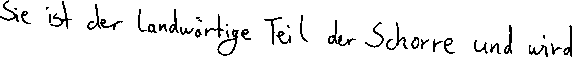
Sie ist der landwärtige Teil der Schorre und wird
